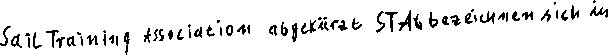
Sail Training Association abgekürzt STA bezeichnen sich in
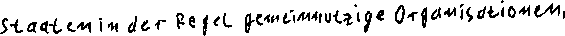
Staaten in der Regel gemeinnützige Organisationen,
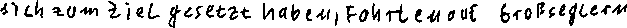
sich zum Ziel gesetzt haben, Fahrten auf Großseglern
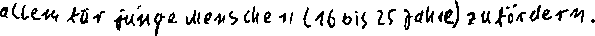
allem für junge Menschen (16 bis 25 Jahre) zu fördern.
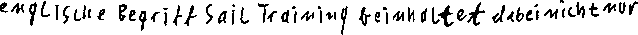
englische Begriff Sail Training beinhaltet dabei nicht nur
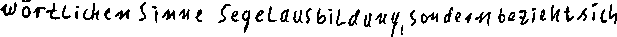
wörtlichen Sinne Segelausbildung, sondern bezieht sich
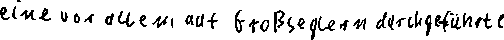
eine vor allem auf Großseglern durchgeführte
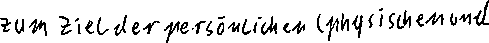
Zum Ziel der persönlichen (physischen und
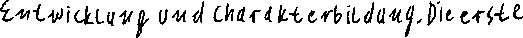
Entwicklung und Charakterbildung.Die erste
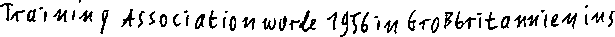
Training Association wurde 1956 in Großbritannien ins
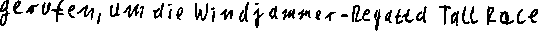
gerufen, um die Windjammer-Regatta Tall Race Cutty
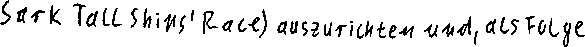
Sark Tall Ships’ Race) auszurichten und, als Folge
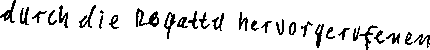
durch die Regatta hervorgerufenen
